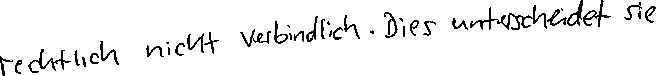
rechtlich nicht verbindlich. Dies unterscheidet sie
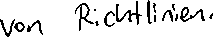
von Richtlinien.
